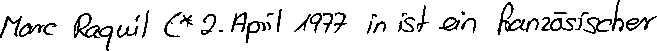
Marc Raquil (* 2. April 1977 in ist ein französischer
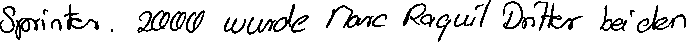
Sprinter. 2000 wurde Marc Raquil Dritter bei den
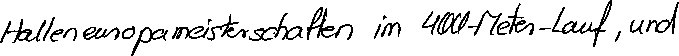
Halleneuropameisterschaften im 400-Meter-Lauf, und
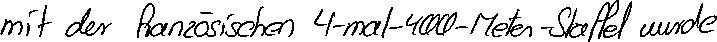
mit der französischen 4-mal-400-Meter-Staffel wurde
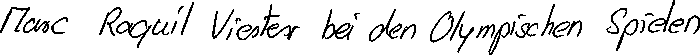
Marc Raquil Vierter bei den Olympischen Spielen
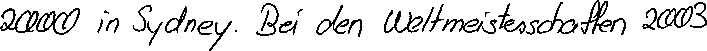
2000 in Sydney. Bei den Weltmeisterschaften 2003
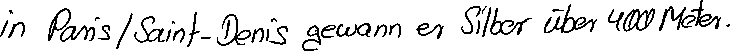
in Paris/Saint-Denis gewann er Silber über 400 Meter.
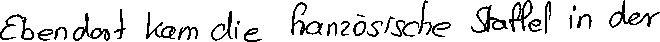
Ebendort kam die französische Staffel in der
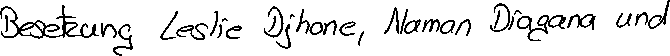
Besetzung Leslie Djhone, Naman Diagana und
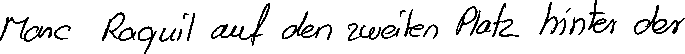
Marc Raquil auf den zweiten Platz hinter der
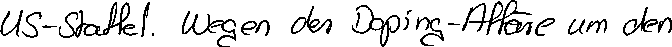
US-Staffel. Wegen der Doping-Affäre um den
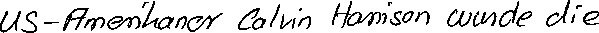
US-Amerikaner Calvin Harrison wurde die
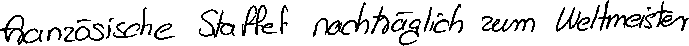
französische Staffel nachträglich zum Weltmeister
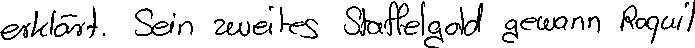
erklärt. Sein zweites Staffelgold gewann Raquil
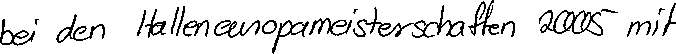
bei den Halleneuropameisterschaften 2005 mit
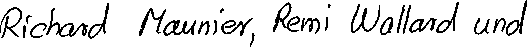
Richard Maunier, Remi Wallard und
